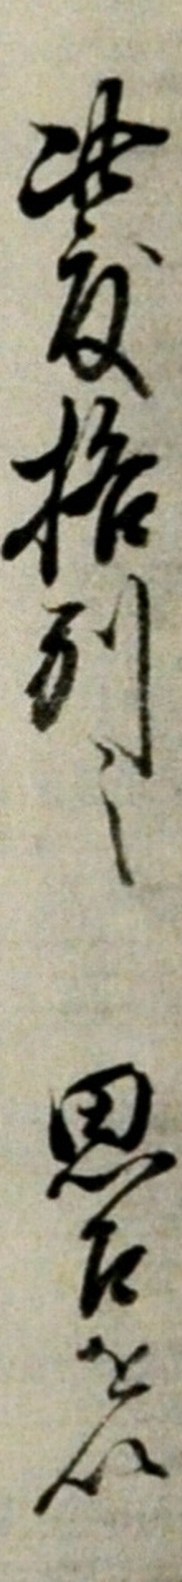此度格別之思召を以
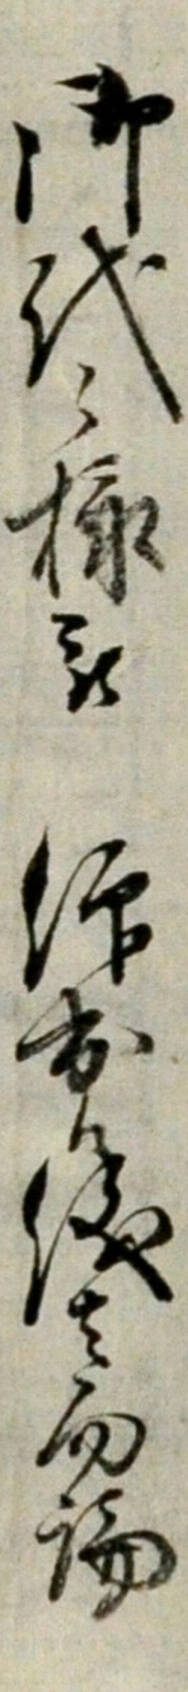御代々様被仰出候儀者勿論
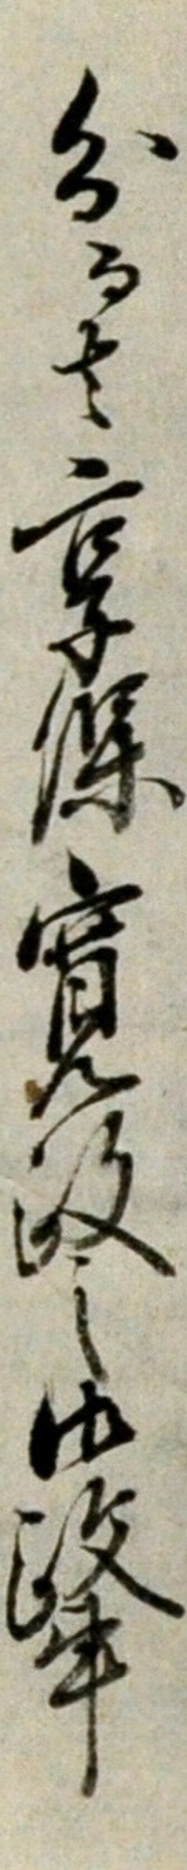分而者享保寛政之御政事
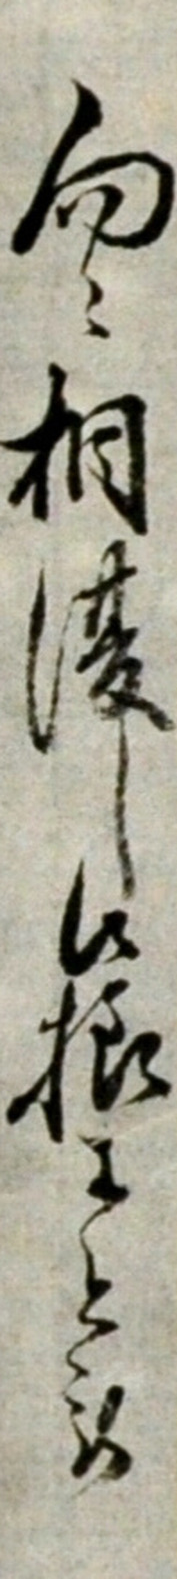向相渡し候様にと被
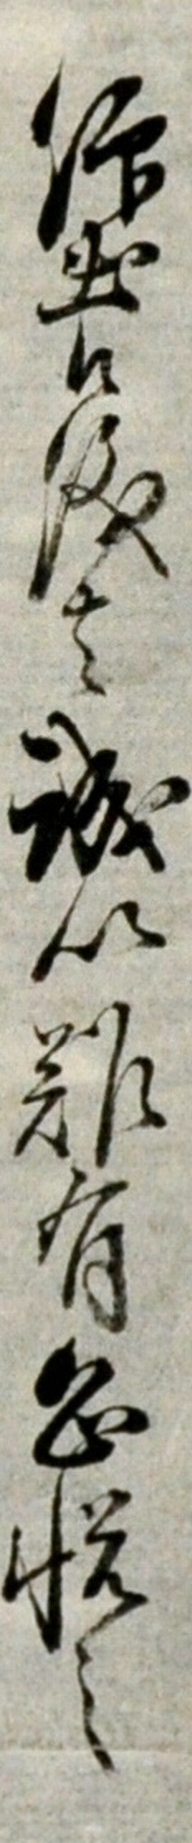仰出候儀者誠以難有心悦之
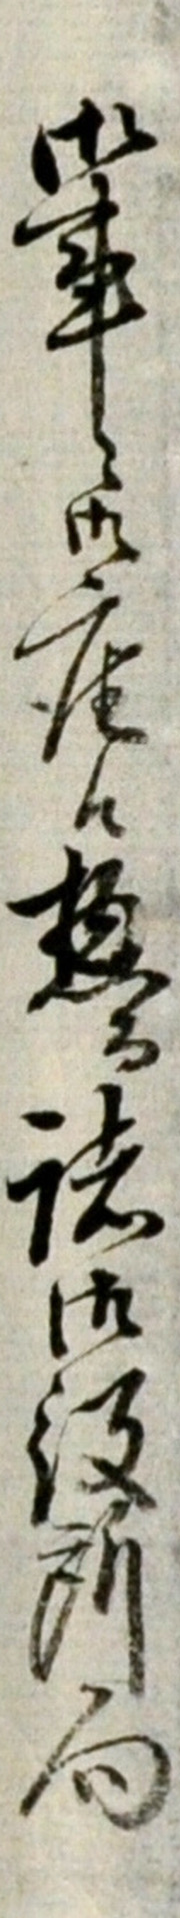御事御座候惣而諸御役所向
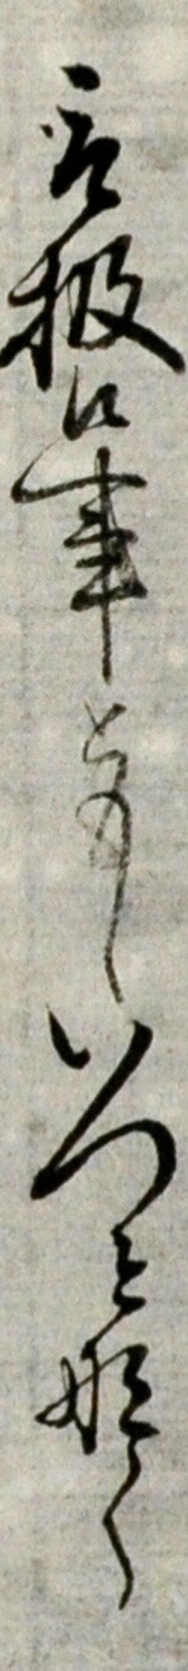取扱候事ともどもいつとなく
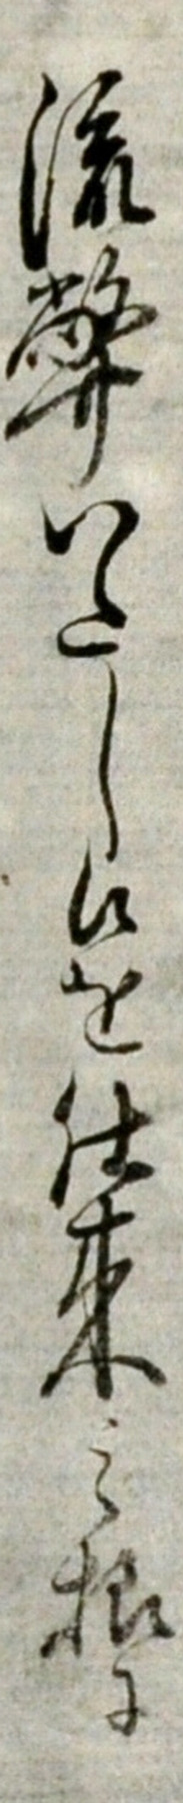流弊いたし候を仕来之様子
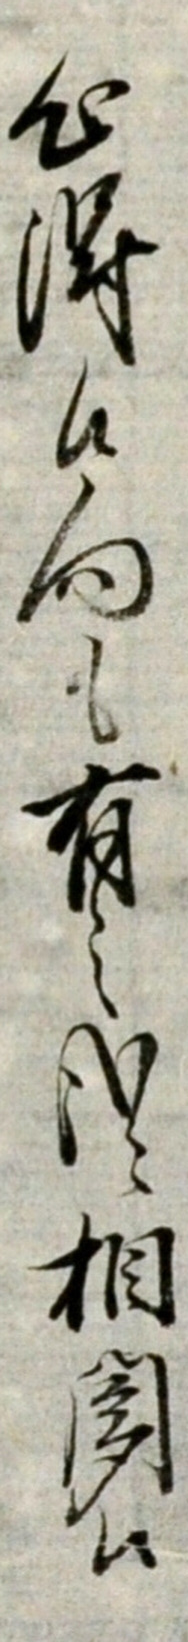心得候向も有之哉と相候
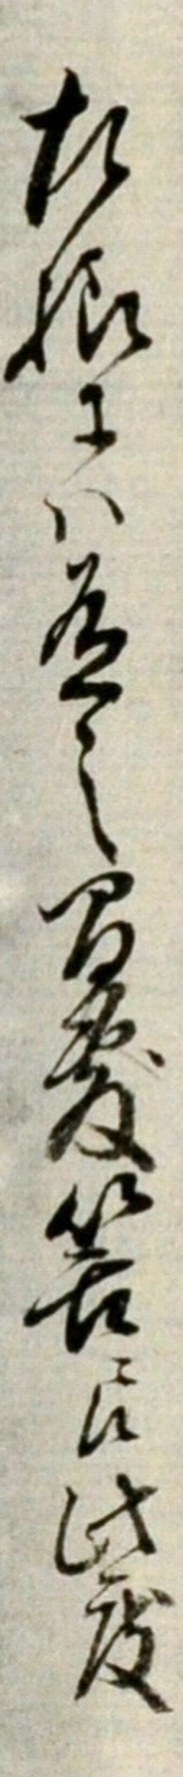左様には有之間敷筈候此度
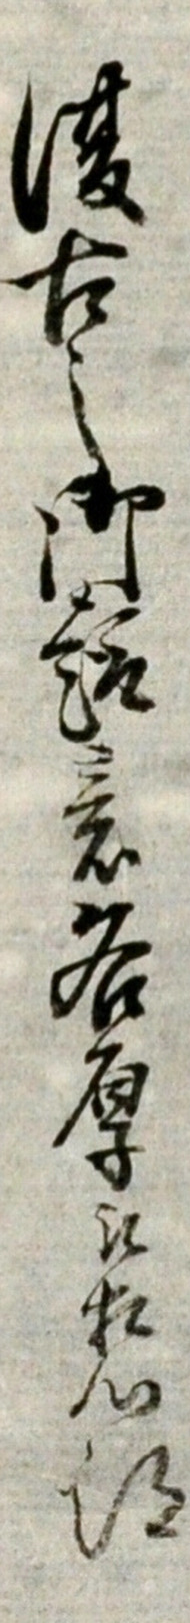後右之御趣意各厚被相心得
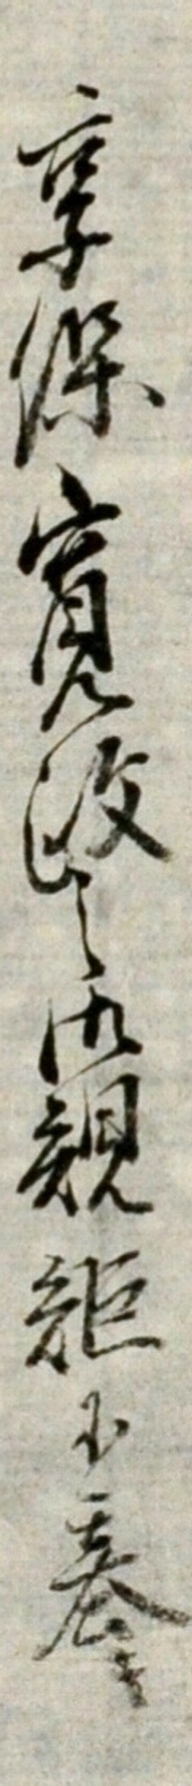享保寛政之御規矩に塞キ
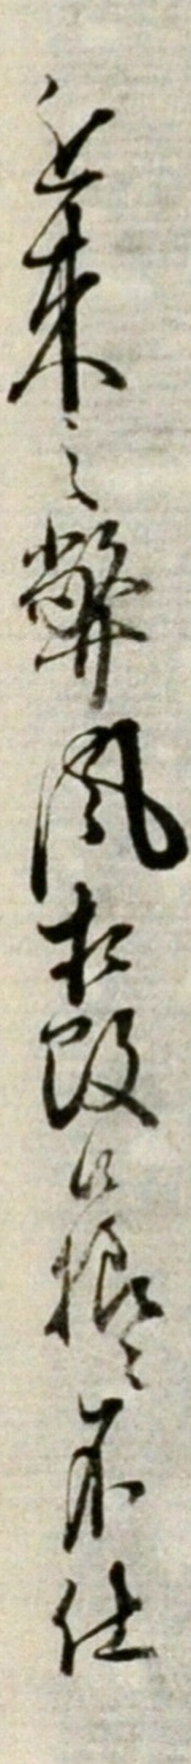近来の弊風相改候様不仕
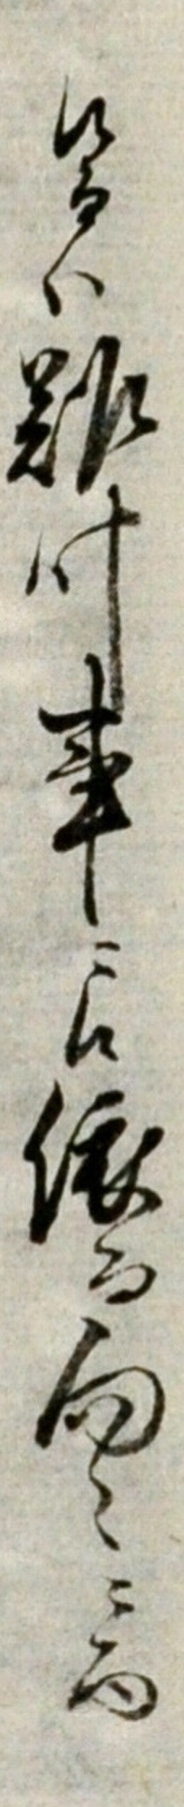候而は難叶事候依而向々而
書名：若年寄御役中御調書付
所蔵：伊那市立高遠町図書館・合同会社AMANE
